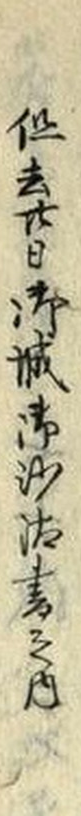但去廿日御城御沙汰書之内
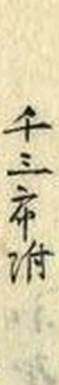千三郎附
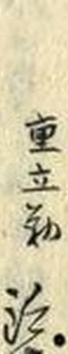重立勤
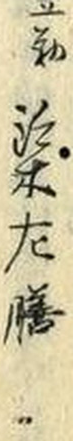鈴木左膳
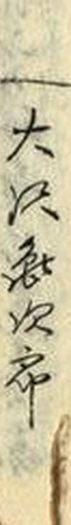大沢亀次郎
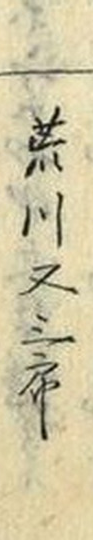荒川又三郎
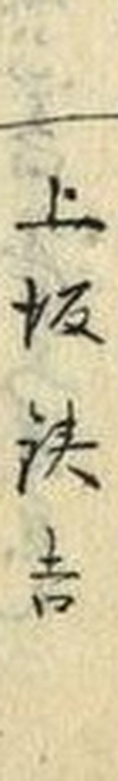上坂鉄吉
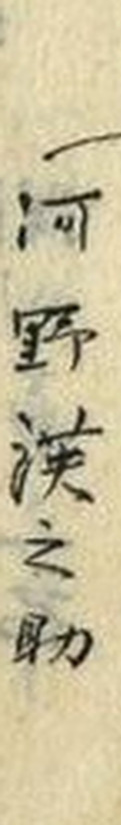河野鍈之助

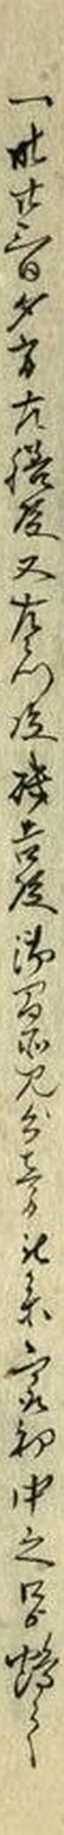一昨廿三日夕方左膳殿又左衛門殿磯吉殿御間所見分旁被参最初中之口ゟ鶴之
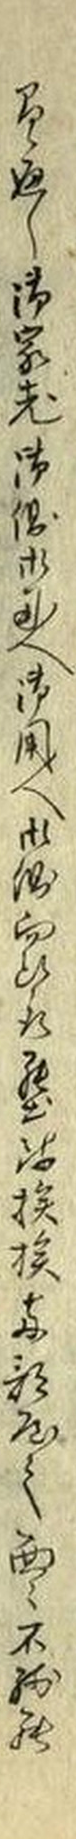間ヘ通し御家老御側御用人御用人御側向頭取罷出致挨拶両部屋之面々不残罷
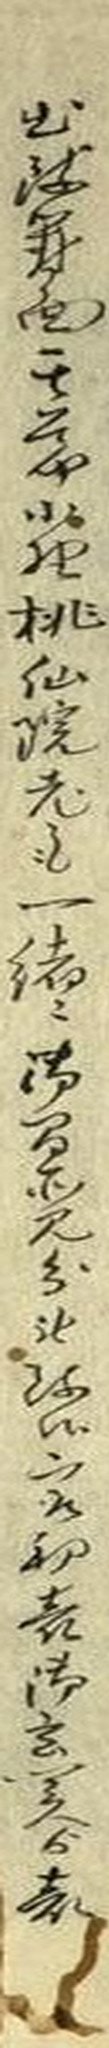出致対面其節小野桃仙院老も一緒ニ御間所見分被致候最初表玄関ゟ表
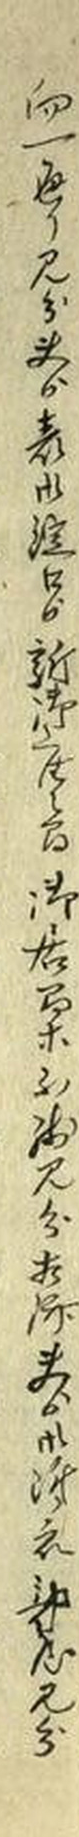向一通り見分夫ゟ表御錠口ゟ新御座之間御居間等不残見分相済夫ゟ御附衆部屋見分
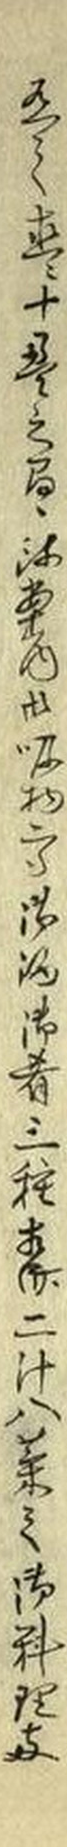有之直ニ十畳之間ヘ致案内御吸物二ツ御酒御肴三種相済二汁八菜之御料理両
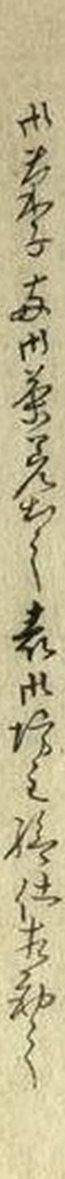御菓子両御茶差出之表御坊主給仕相勤之
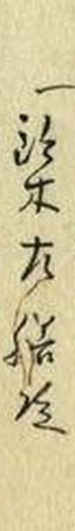鈴木左膳殿
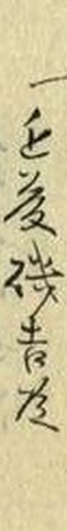近藤磯吉殿
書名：少傅日録抄（斉善付側向頭取日記、在府）
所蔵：福井県文書館 Fukui Prefectural Archives
